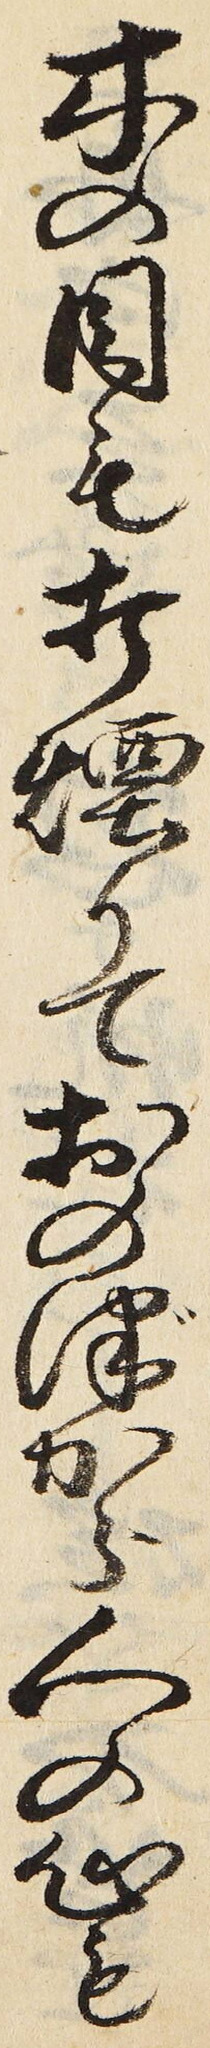木の目も打煙りておのづから人の心も
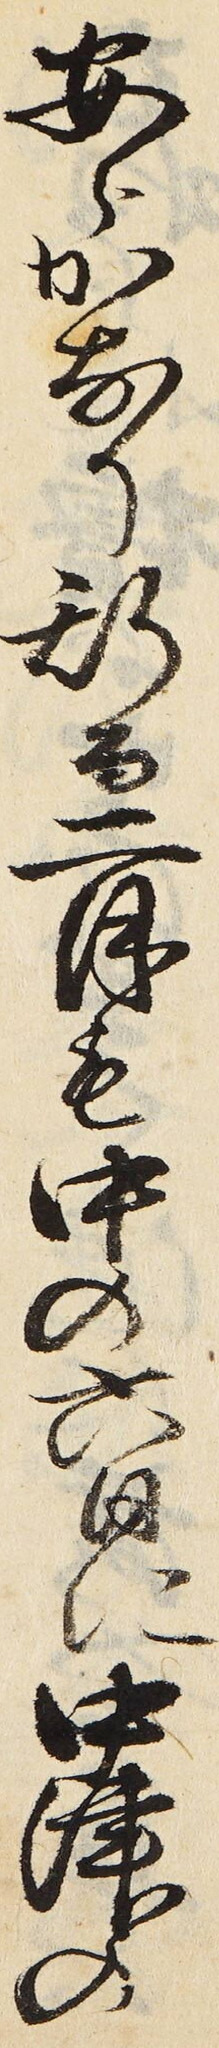安らかなり斯而二月も中の六日に中津の
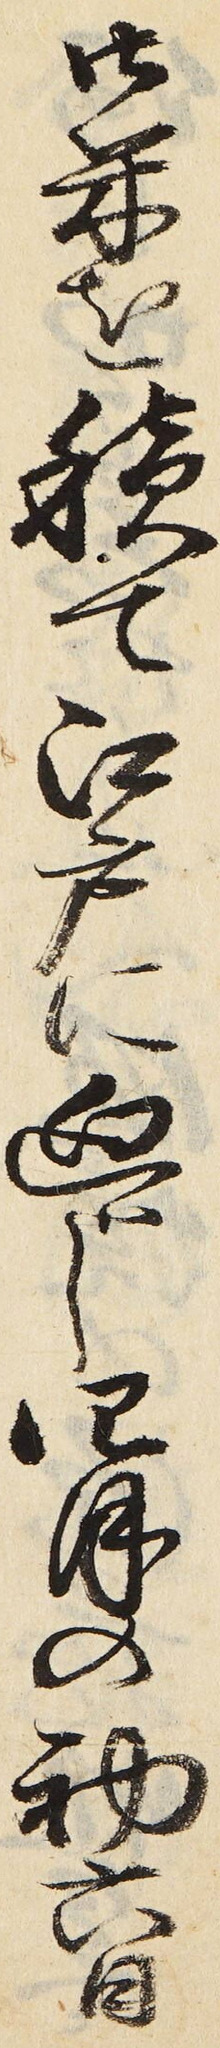御米を積て江戸に廻はし四月の初六日
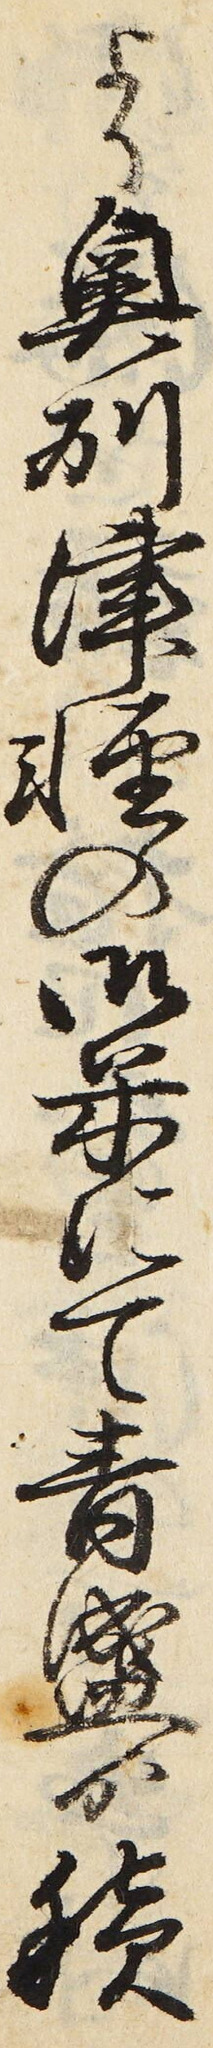より奥州津軽の御米にて青盛ゟ積
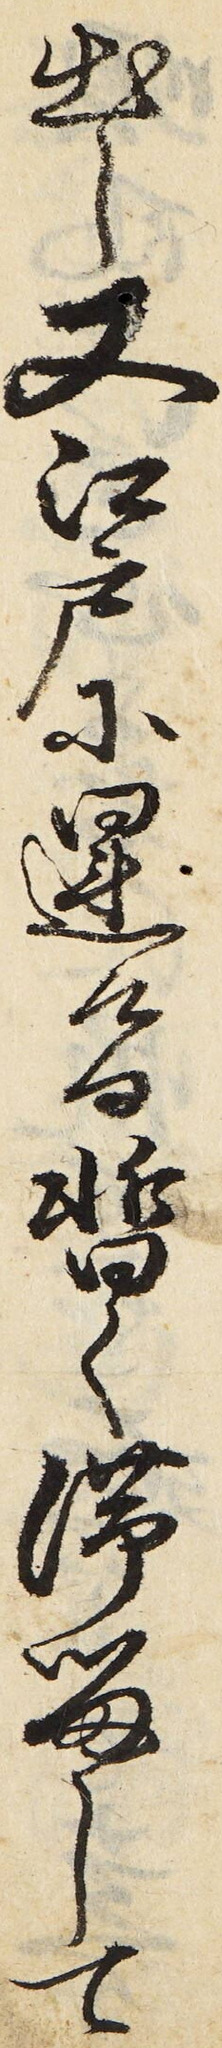出し又江戸に還ける暫く滞留して
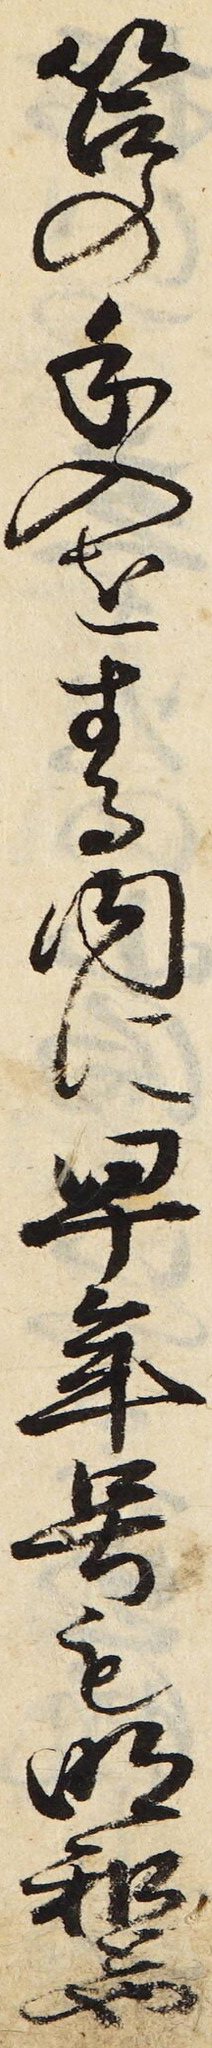筈の手入をする内に早年号も明和とや
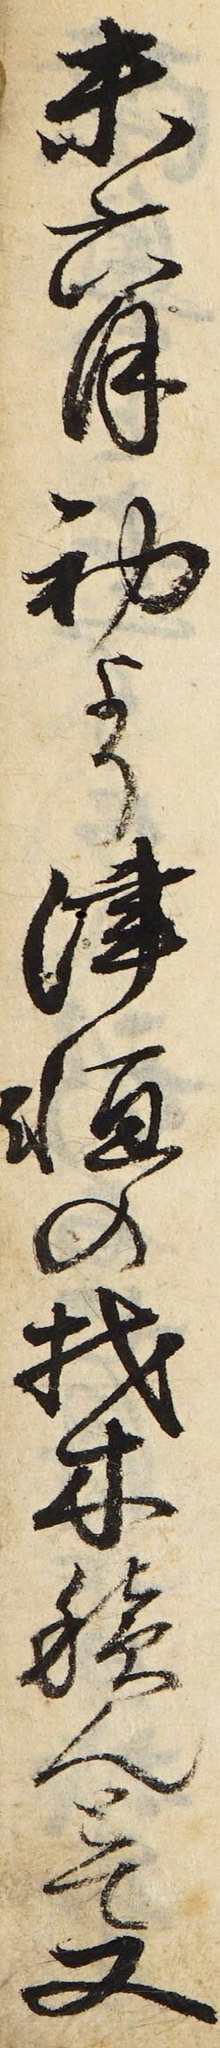未六月初より津軽の材木積んとて又

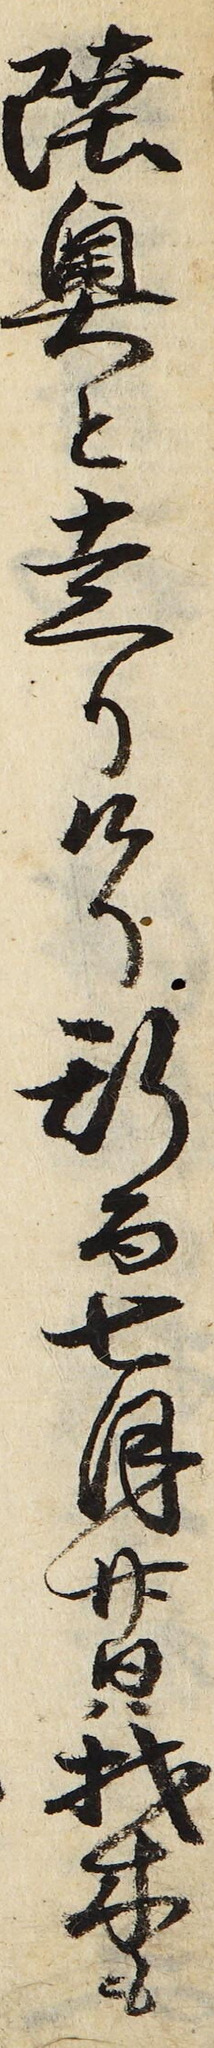陸奥と走りけり斯而七月廿日は材木も
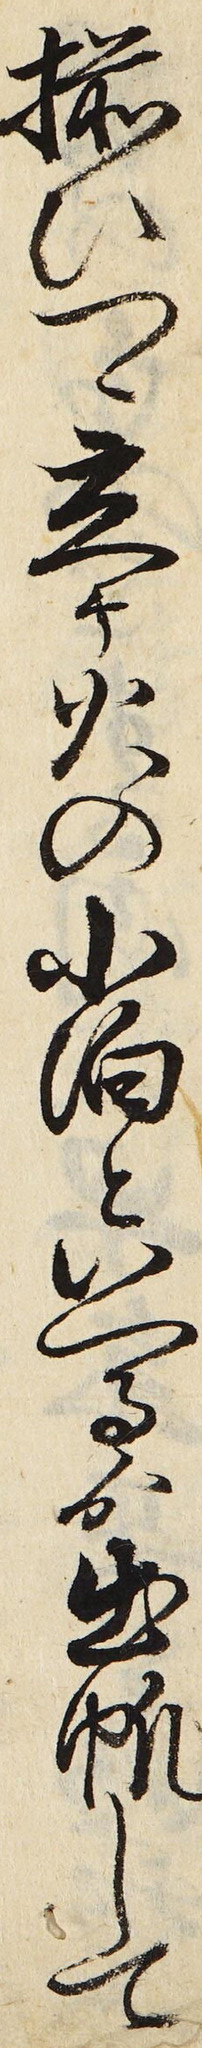揃ひつゝ立ち火の小泊といへるゟ出帆して
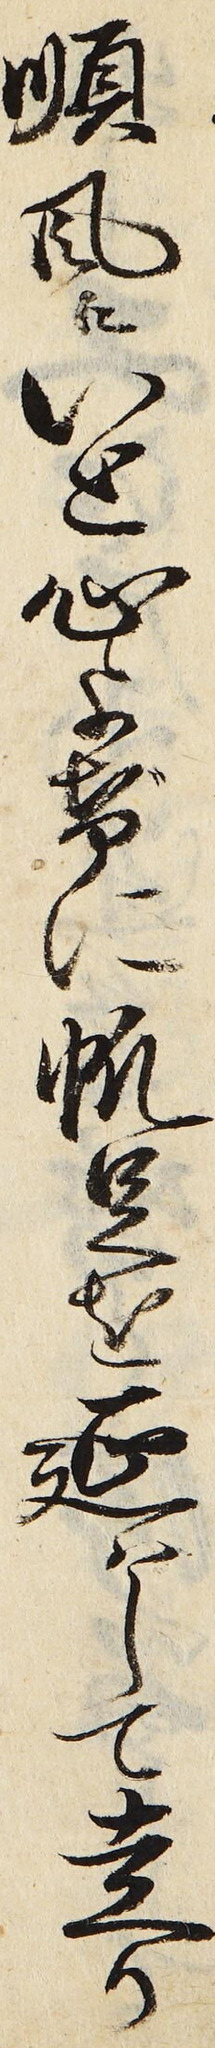順風えいと心よげに帆足を延はして走り
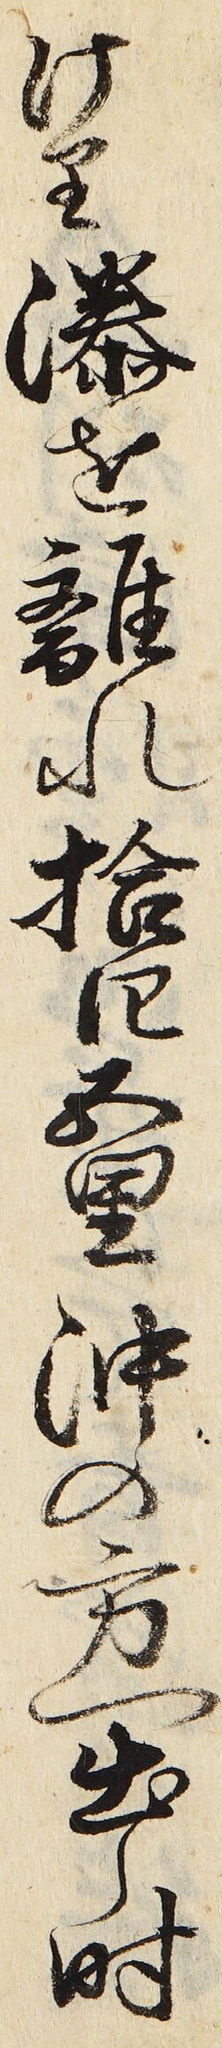けり湊を離れ拾四五里沖の方へ出し時
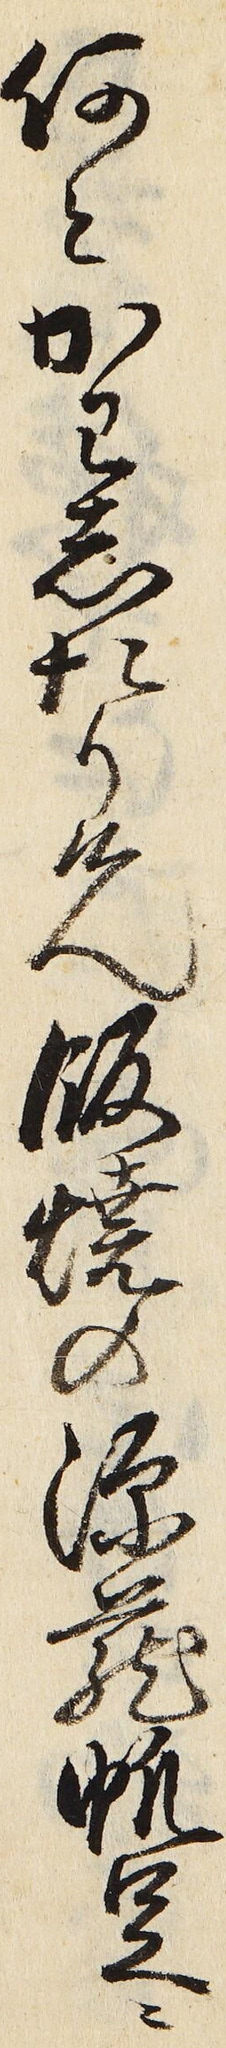何とかわしたりけん飯焼の源蔵帆足に
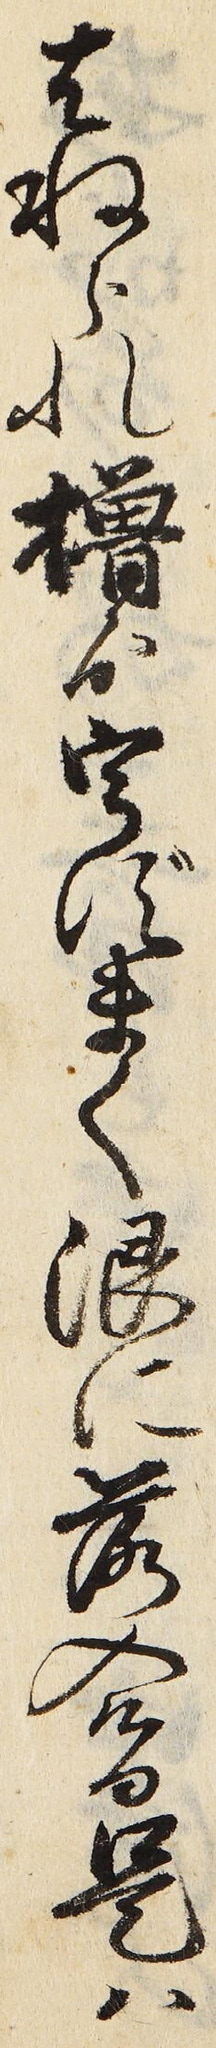はねられ櫓ゟうずまく浪に落入ける是は
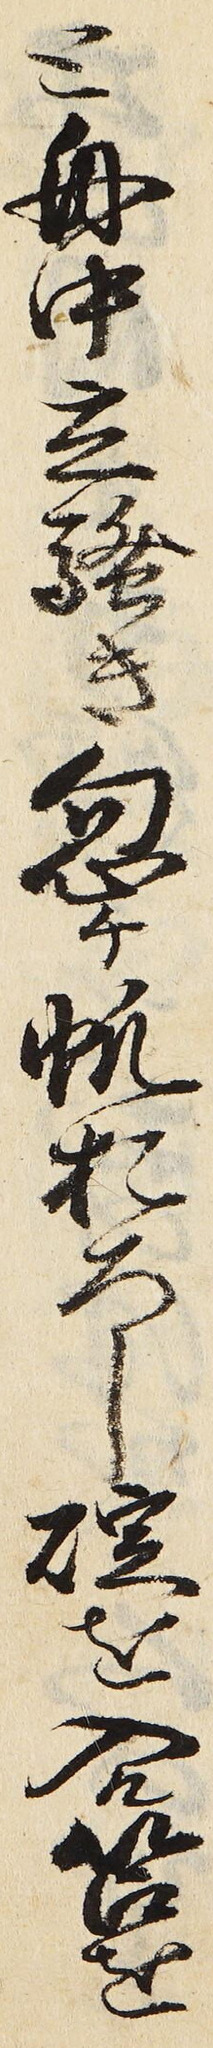と舟中立騒き忽ち帆おろし碇を入る筈を
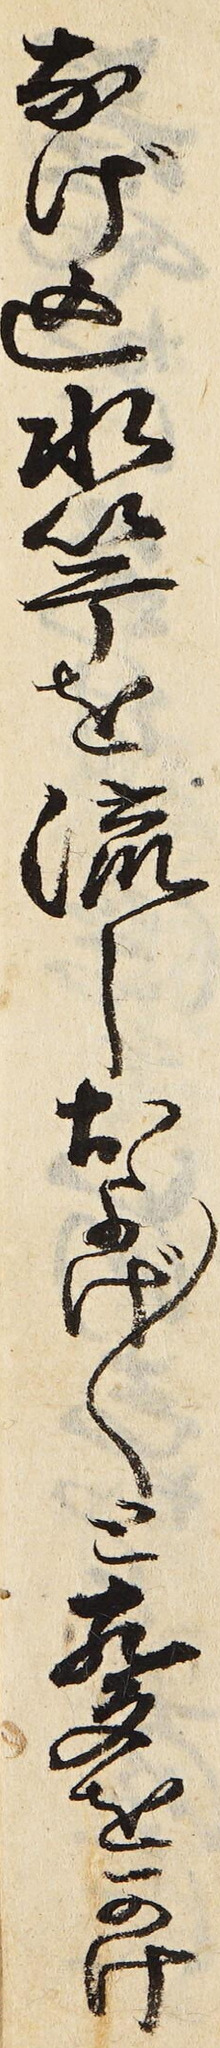なげ込水竿を流しおよげ〳〵と声をかけ
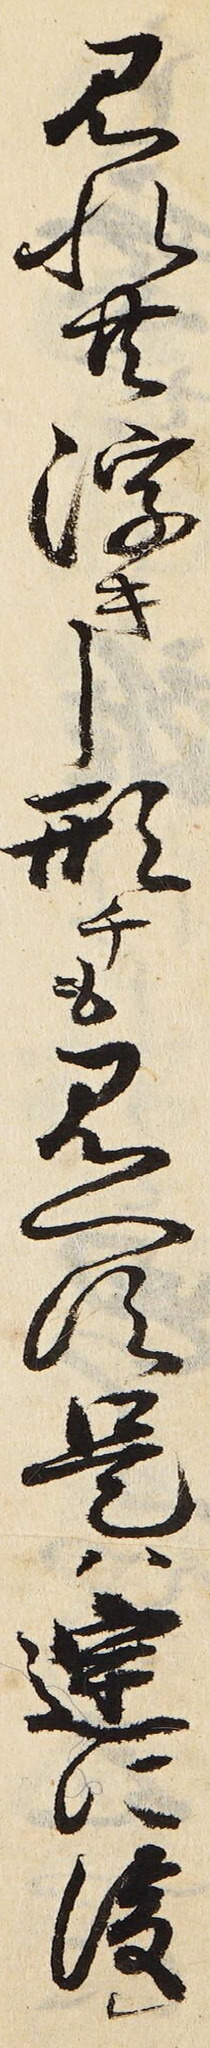見れ共浮きし形チも見へす是はに後れ
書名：華夷九年録
